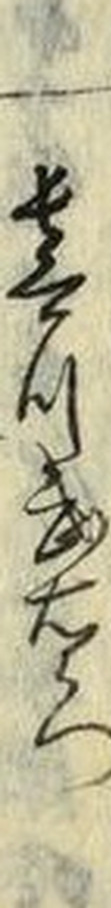長谷川武右衛門
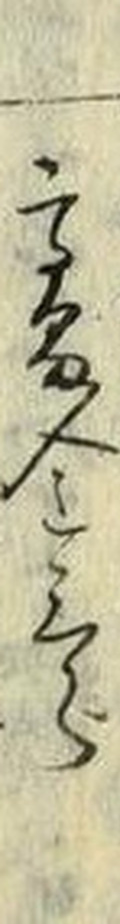高畠金三郎
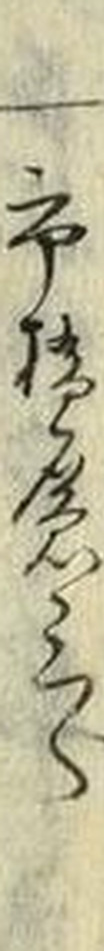市橋廉三郎
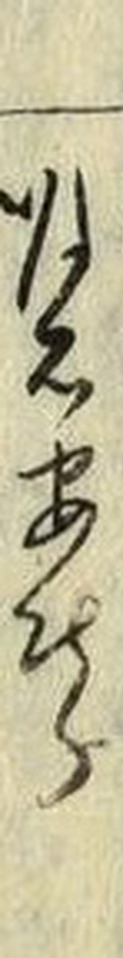明石安次郎
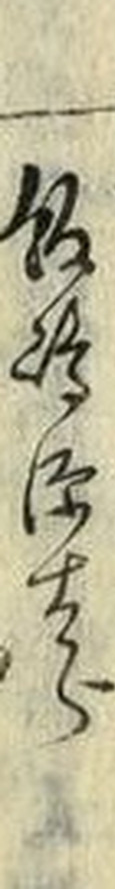飯嶋源太郎
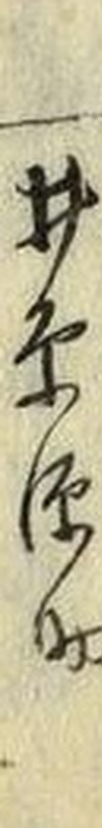井原源助
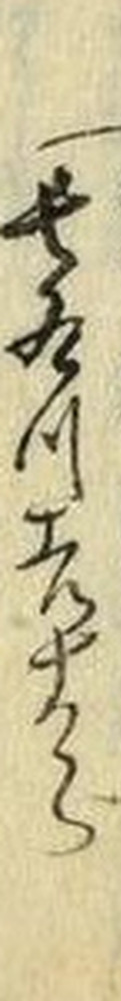長谷川吉太郎
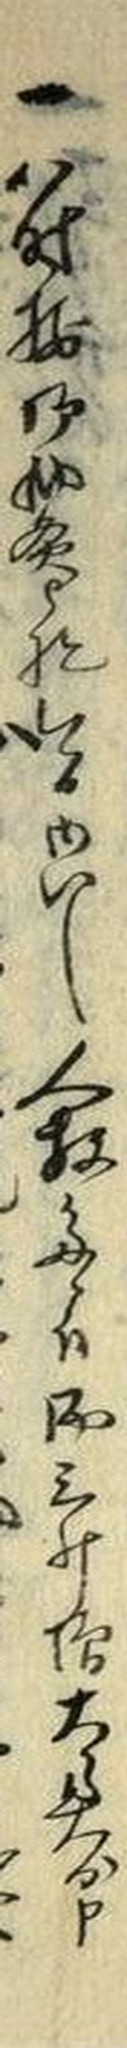一八時揃御納灸被遊今日御いし人数多ニ付酒三升増大奥ゟ申
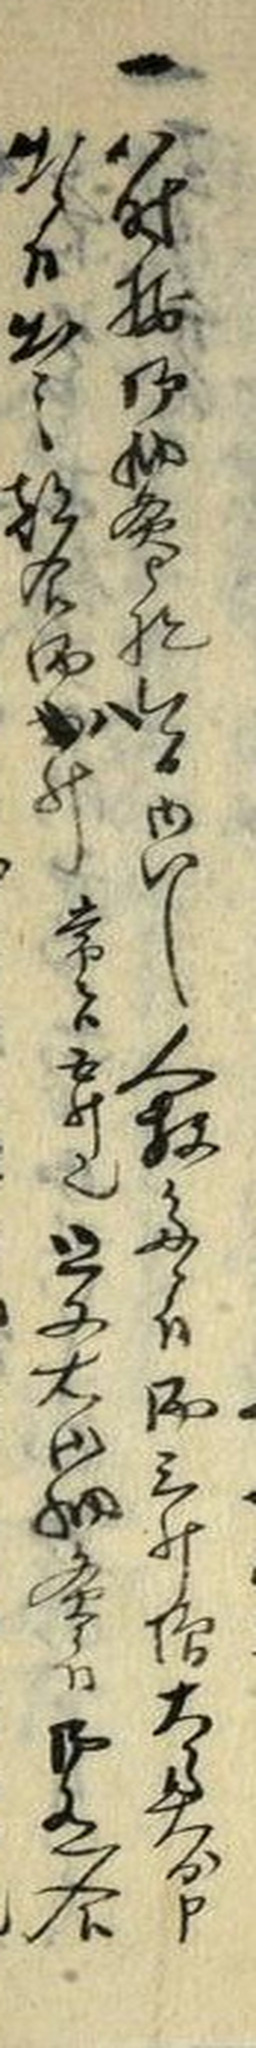出候ニ付出之都合酒八升常ニハ五升也且又右御納灸ニ付御有合
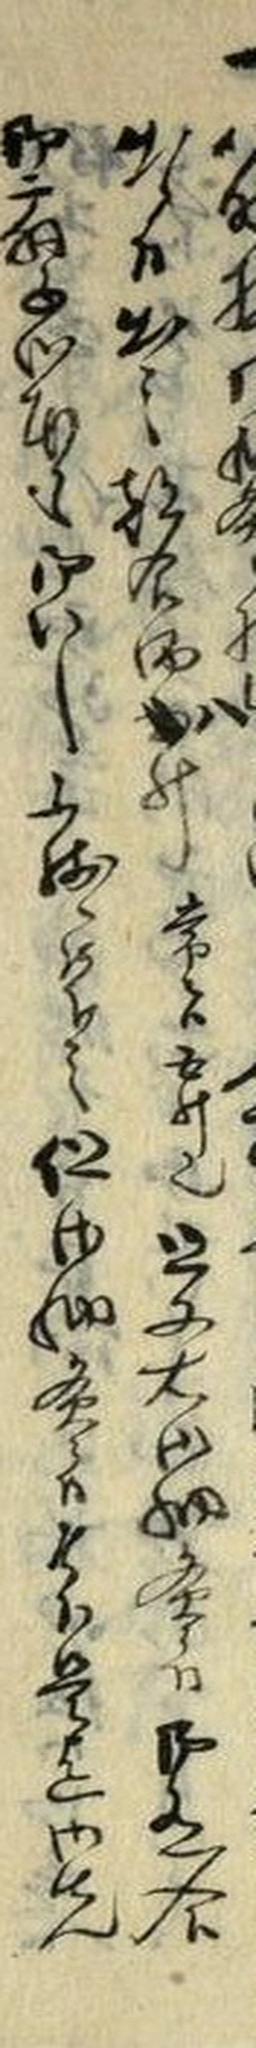御扇子弐本ツヽ御いし不残へ被下之但御納灸ニ付被下是迄御先

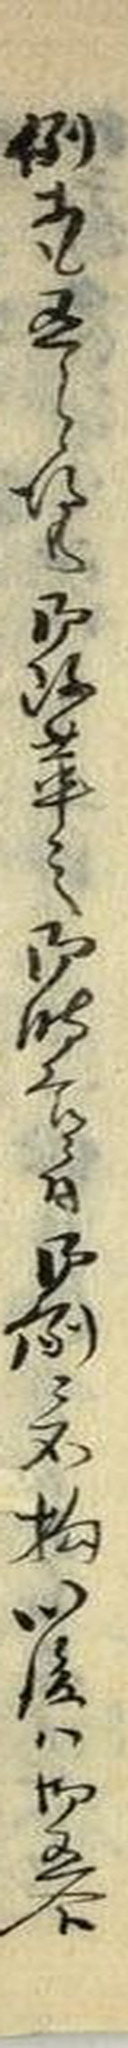例等も有之候得共御改革之御時節ニ付御例ニ不拘以後ハ御有合
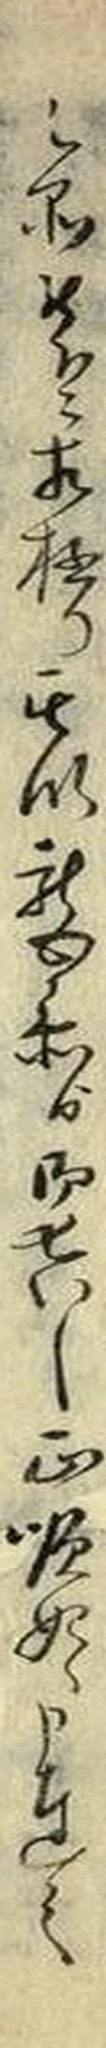之品被下ニ相極り其段新五兵衛ゟ御匙いし正順始へ申達之
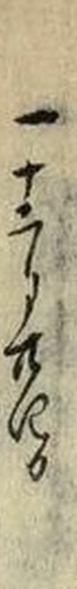一十二月廿四日
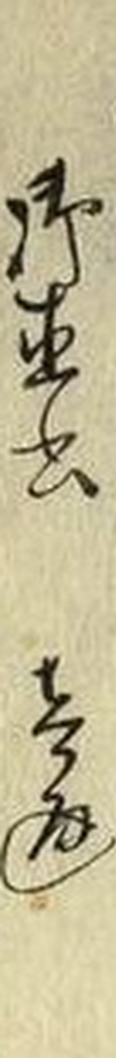御直書壱通
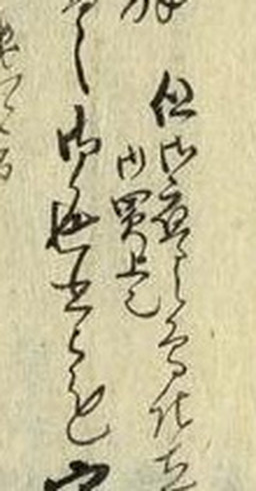御買上也
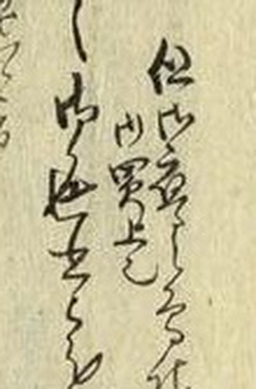御買上也
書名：少傅日録抄（斉承付側向頭取日記、在国）
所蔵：福井県文書館 Fukui Prefectural Archives
